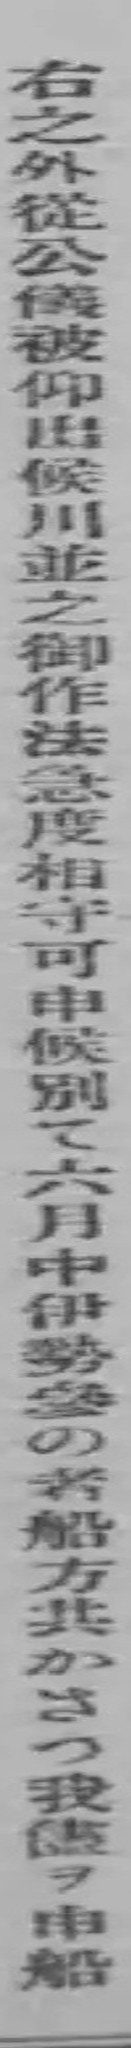右之外従公儀被仰出候川並之御作法急度相守可申候別て六月中伊勢参の者船方共かさつ我儘ヲ申船
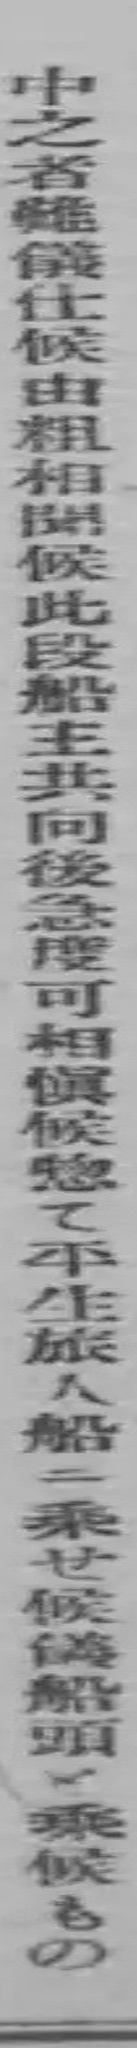中之者難儀仕候由粗相聞候此段船主共向後急度可相慎候惣て平生旅人船ニ乗せ候儀船頭と乗候もの
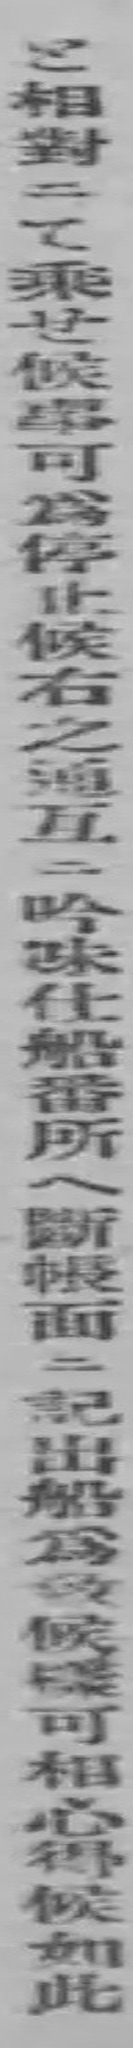と相対ニて乗せ候事可為停止候右之通互ニ吟味仕船番所へ断帳面ニ記出船為致候様可相心得候如此
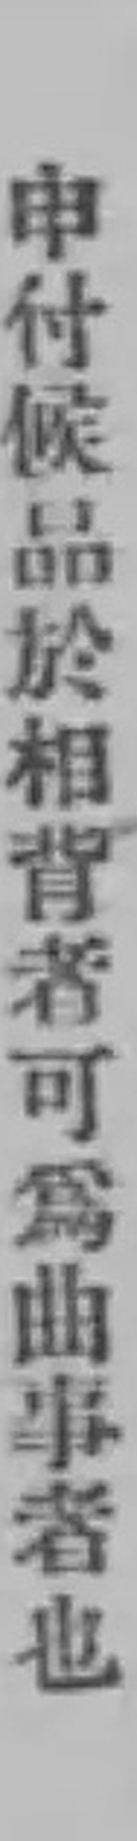申付候品於相背者可為曲事者也
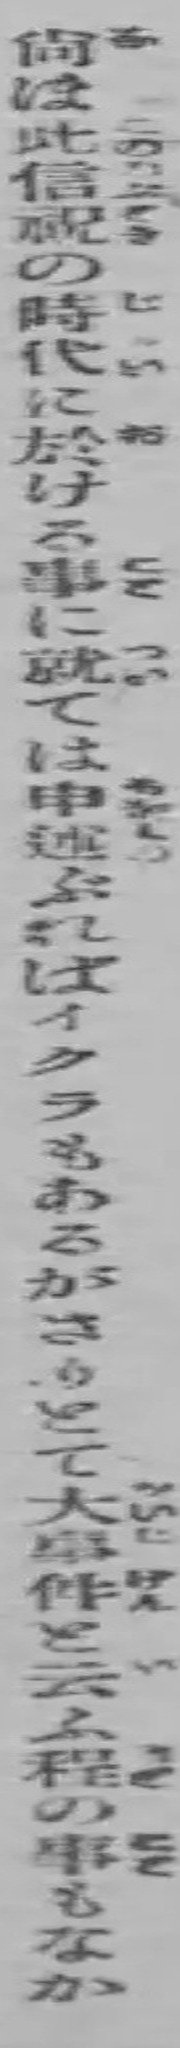尚ほ此信祝の時代に於ける事に就ては申述ぶればイクラもあるがさりとて大事件と云ふ程の事もなか
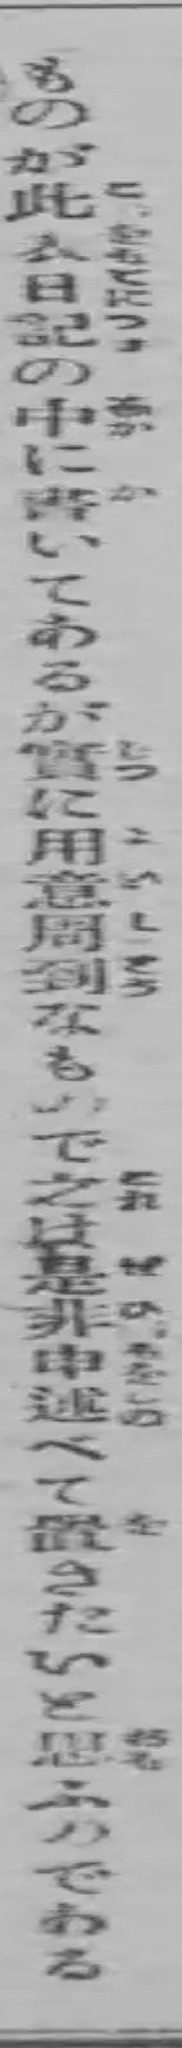ものが此表日記の中に書いてあるが実に用意周到なもので之は是非申述べて置きたいと思ふのである
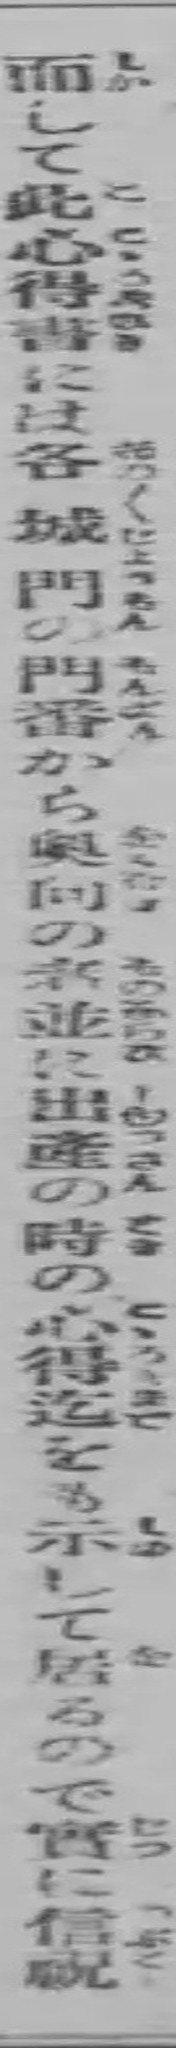而して此心得書には各城門の門番から奥向の者並に出産の時の心得迄をも示して居るので実に信祝
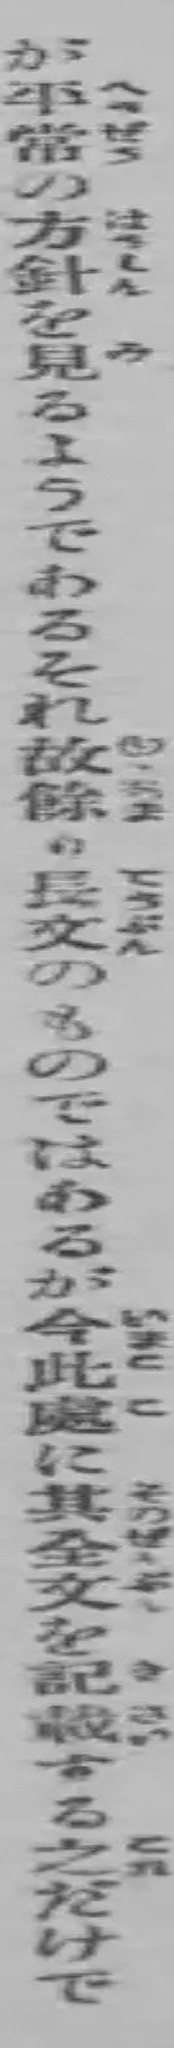が平常の方針を見るようであるそれ故余り長文のものではあるが今此処に其全文を記載する之だけで
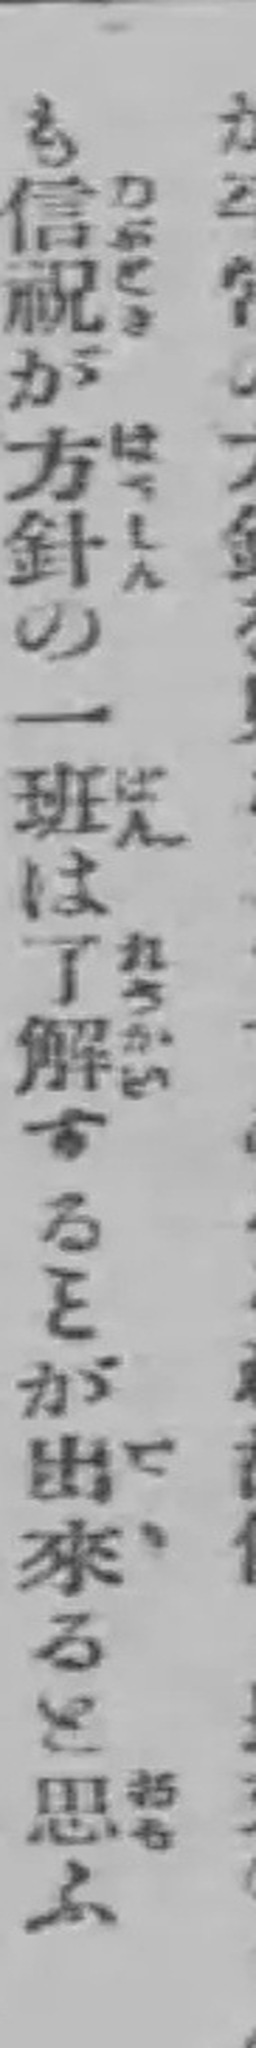も信祝が方針の一班は了解することが出来ると思ふ
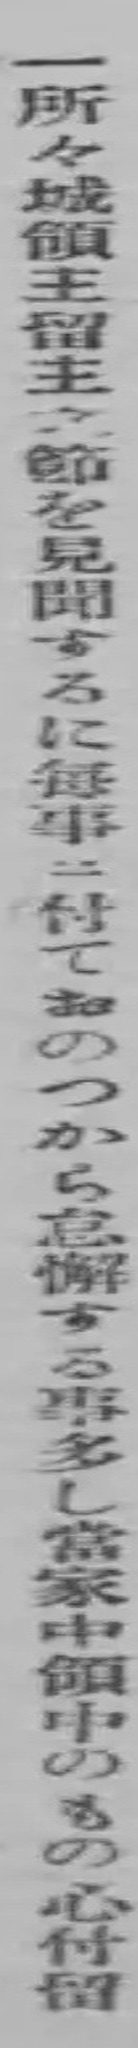一所々城領主留主之節を見聞するに毎事ニ付ておのつから怠懈する事多し当家中領中のもの心付留
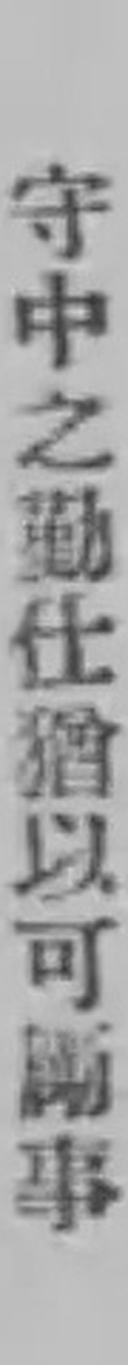守中之勤仕猶以可励事
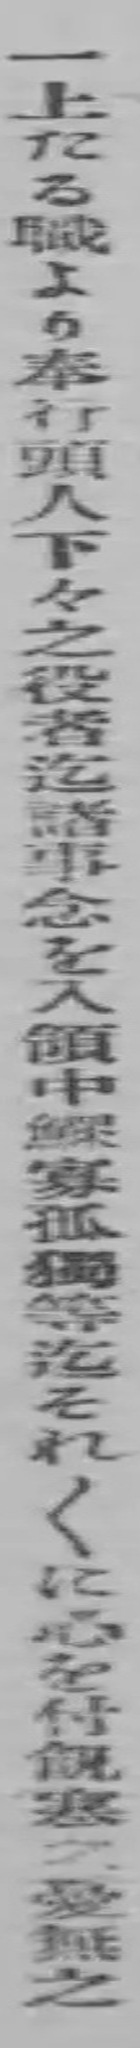一上たる職より奉行頭人下々之役者迄諸事念を入領中鰥寡孤独等迄それ〳〵に心を付飢寒之憂無之
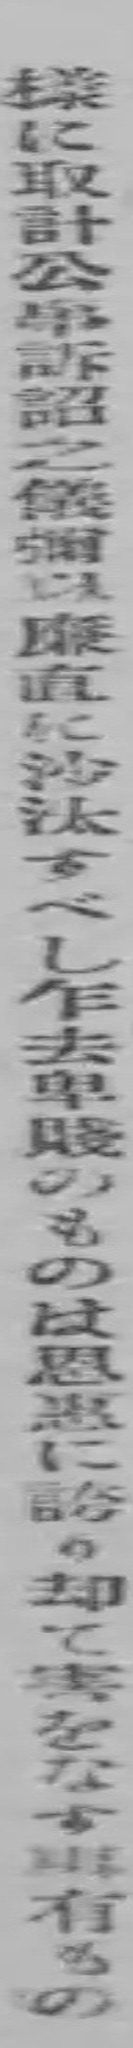様に取計公事訴詔之儀弥以廉直に沙汰すべし乍去卑賎のものは恩恵に誇り却て害をなす事有もの
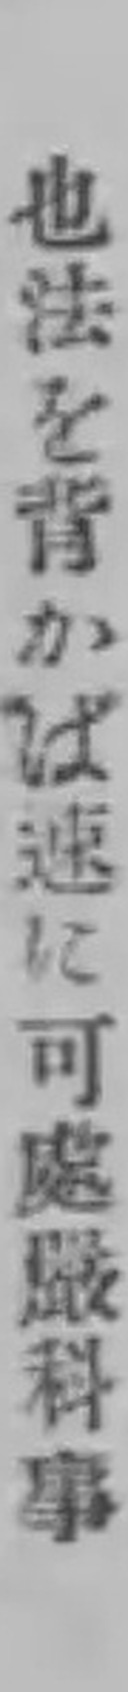也法を背かば速に可処厳科事
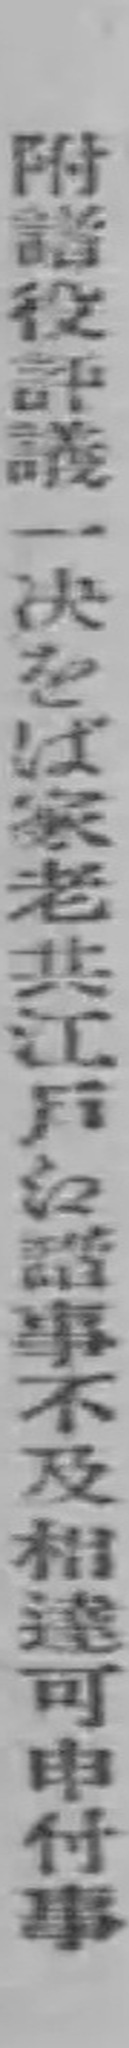附諸役評議一決をば家老共江戸え諸事不及相達可申付事

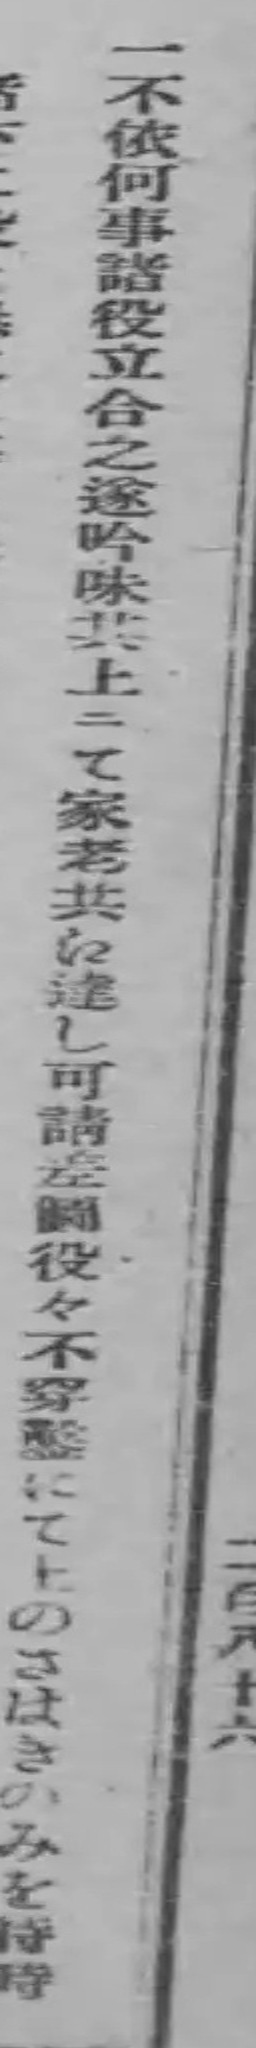一不依何事諸役立合之遂吟味其上ニて家老共え達し可請差図役々不穿鑿にて上のさはきのみを待時
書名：豊橋市史談
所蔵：国立国会図書館 National Diet Library, JAPAN
